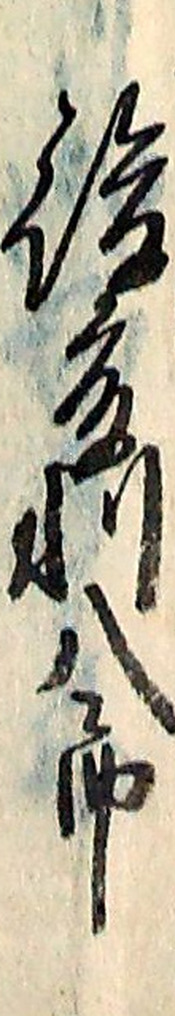後藤利八郎
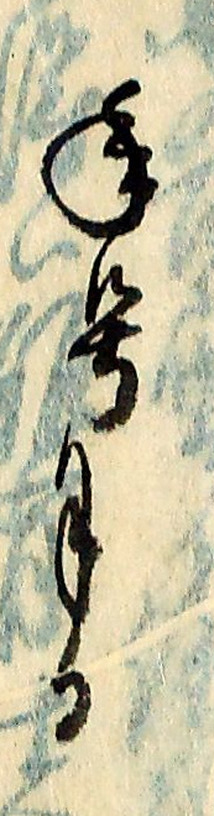年号月日
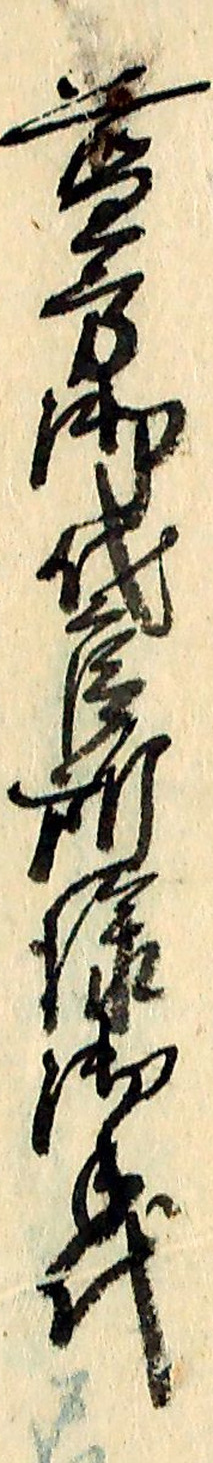藍方御代官所様御手代
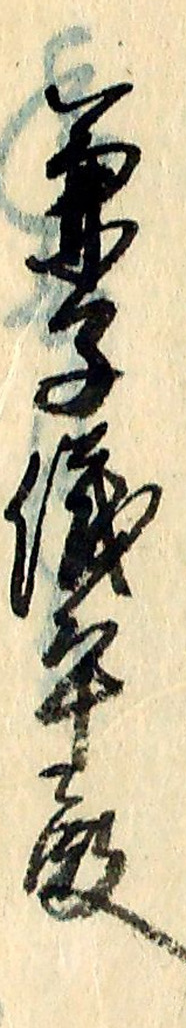兼子儀平殿
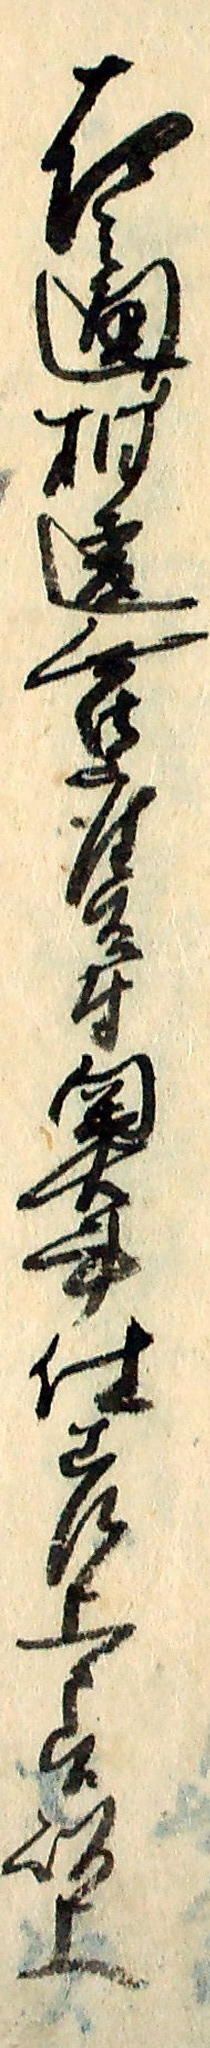右之通り相違無御座候に付奥書仕差上申候以上
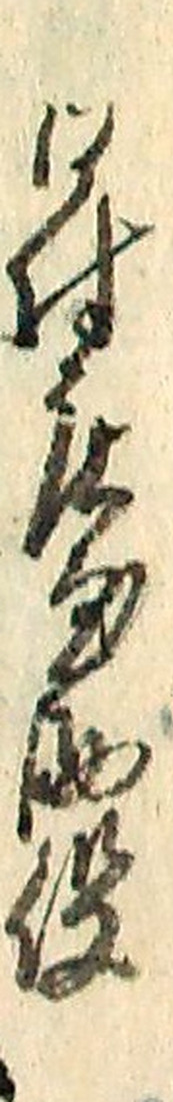同村庄屋助役
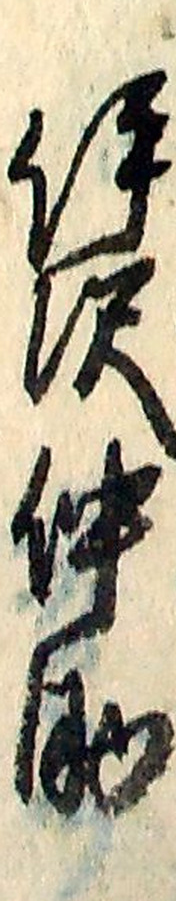伊沢仲助
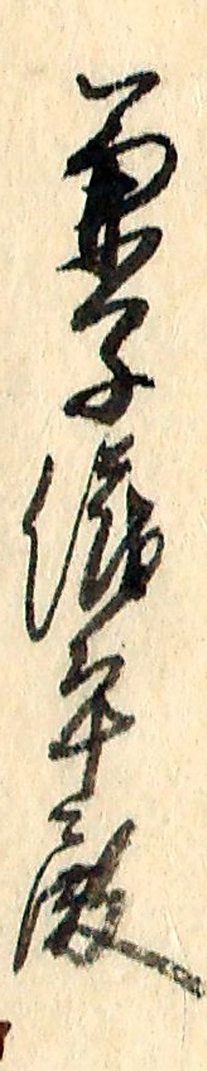兼子儀平殿

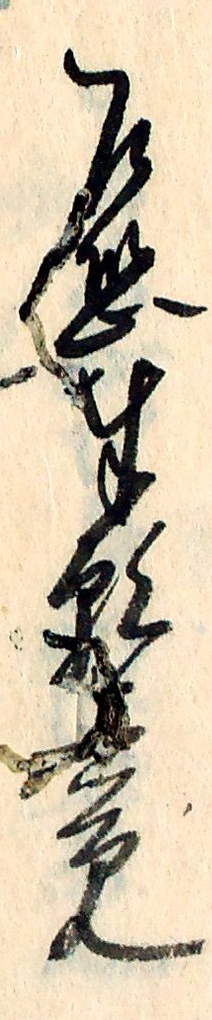乍恐奉願上覚
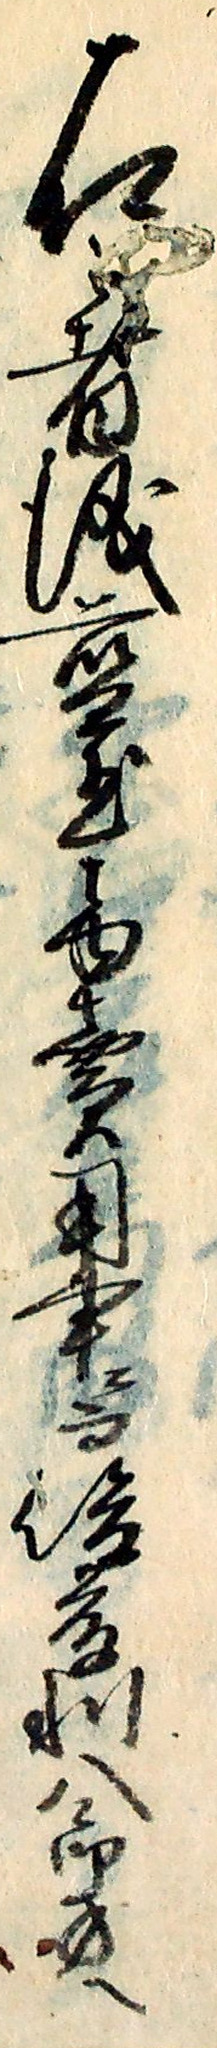右之者儀藍玉商売用事にて後藤利八郎方へ
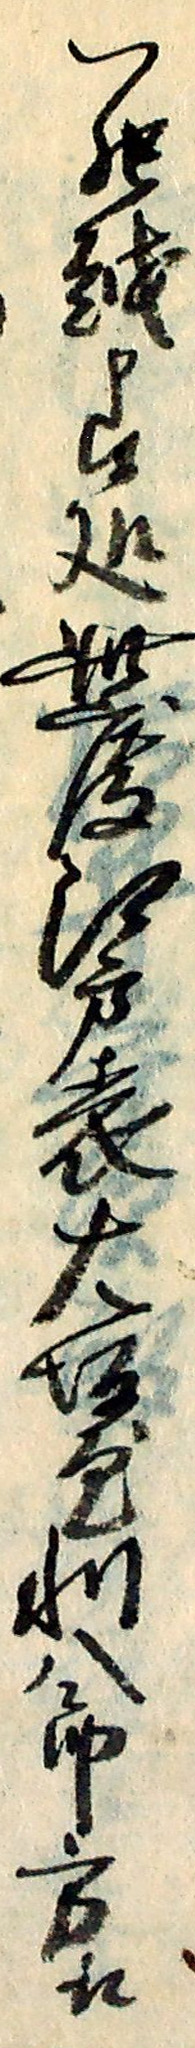罷越申候処此度江戸表大坂屋利八郎方え
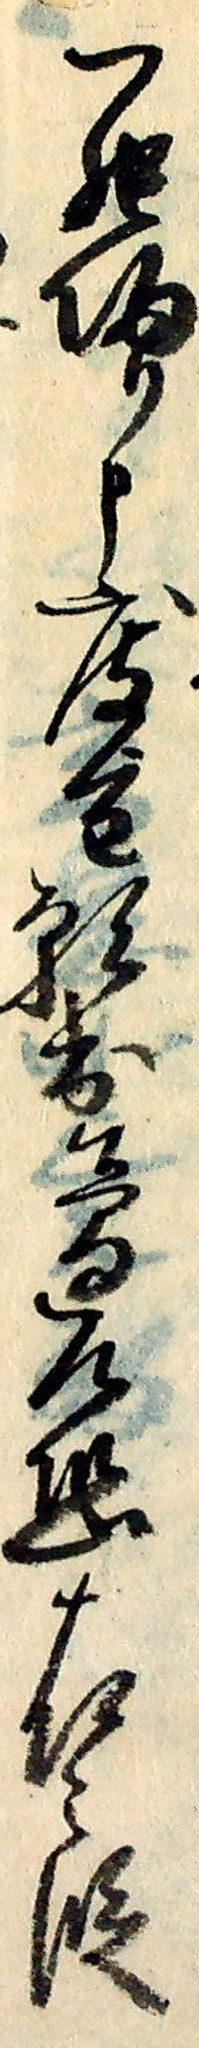罷帰り申度旨願出候間乍恐右之段
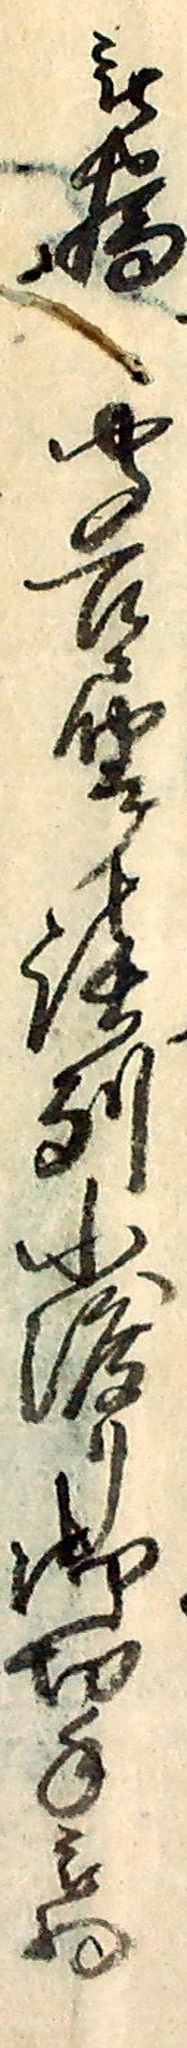被為聞召届け淡州小渡り御切手被為
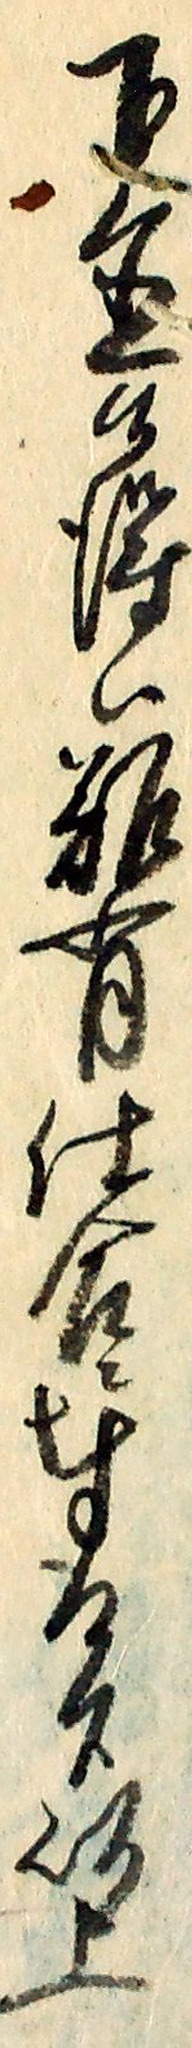下置候得は難有仕合に奉存候以上
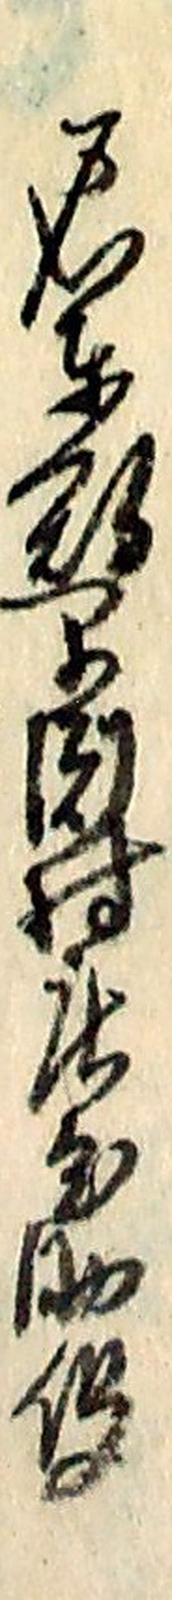名東郡早淵村庄屋助役
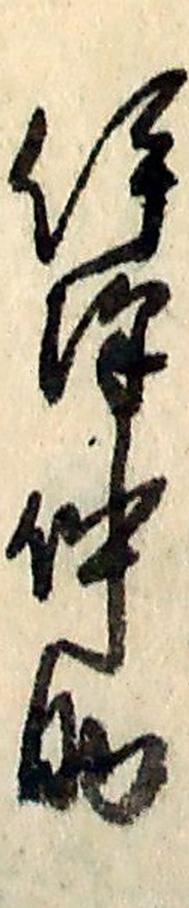伊沢仲助
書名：諸御願書控(後藤氏壱番）
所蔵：鳴門教育大学 Naruto University of Education
